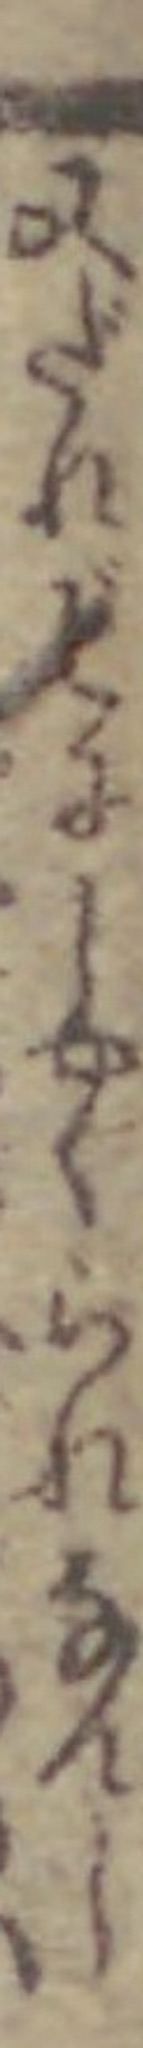又だれぞにしやくられなんし
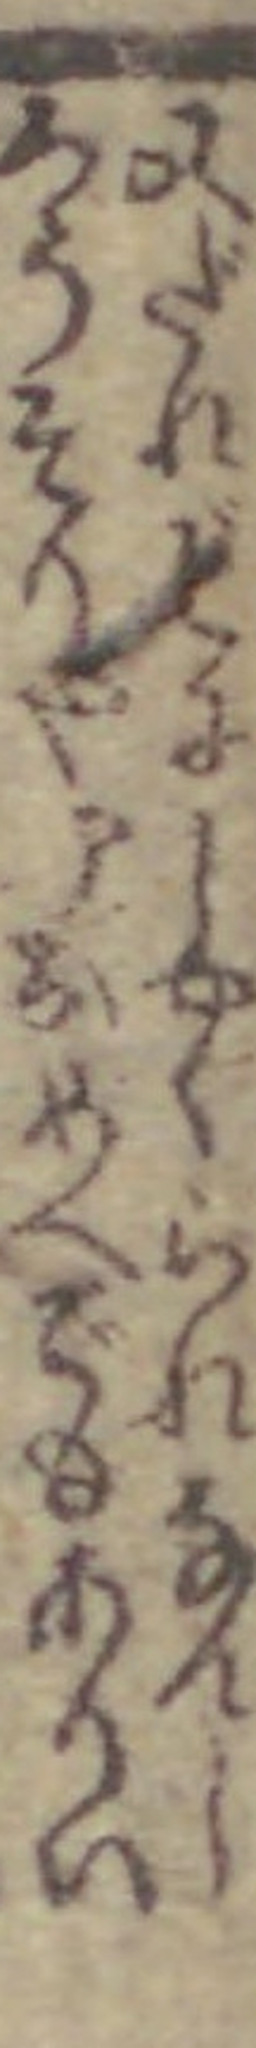ろうそりやアおめへでもありい
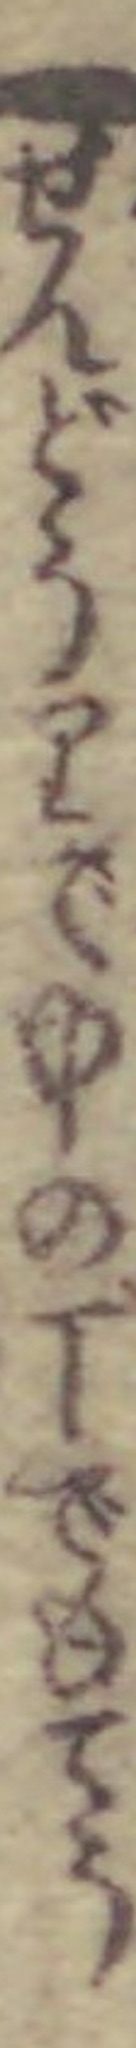せんどうりで中の丁でもてう
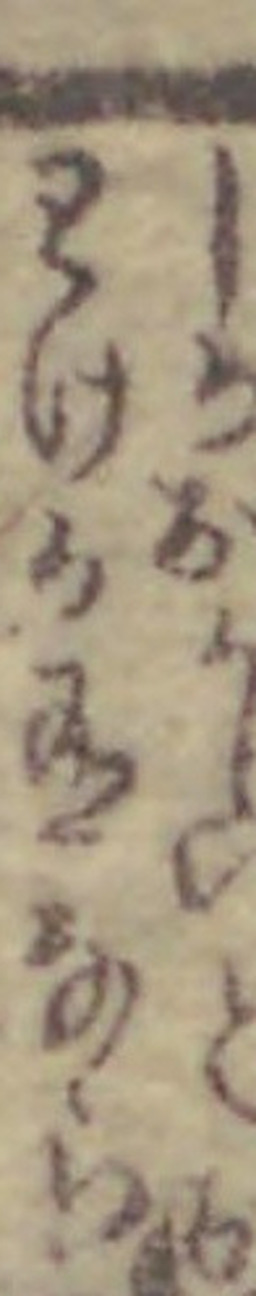わけか有なら
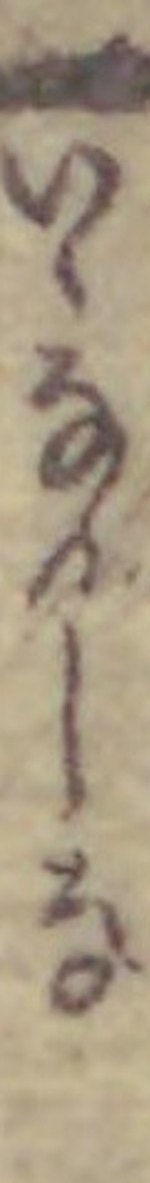いゝなんしな
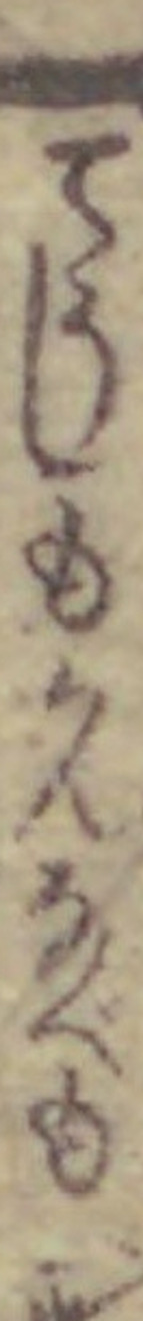「てうしもかんなべも
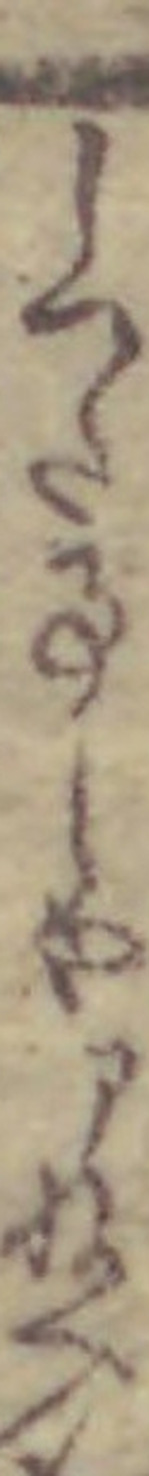しつた事じやアねへ
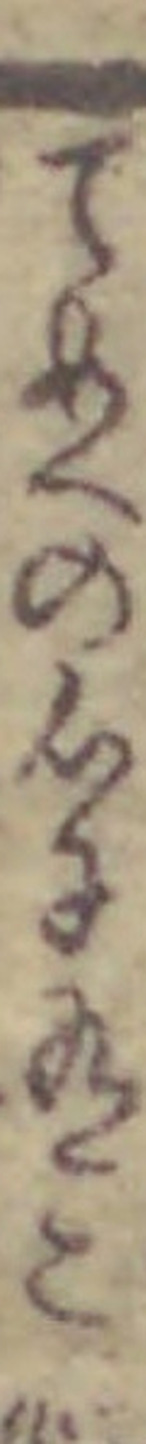てめへの心に有こ
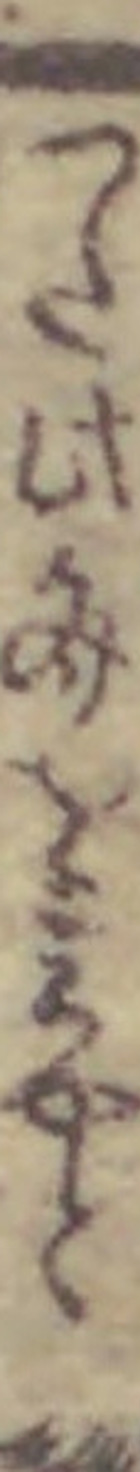つた此文をみやと
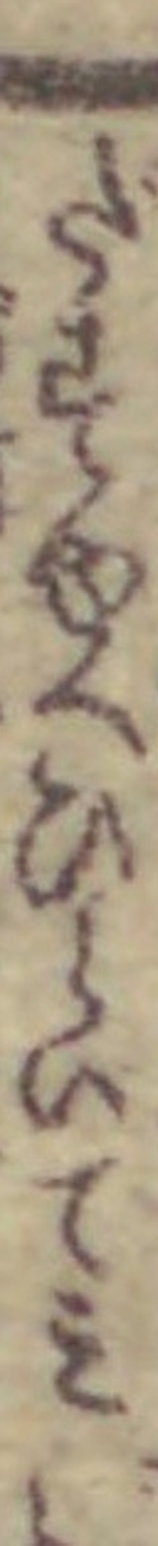だすゆへひらいてみ
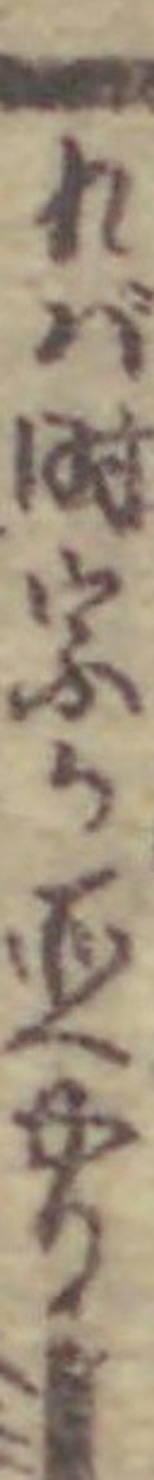れば時宗か所へやり
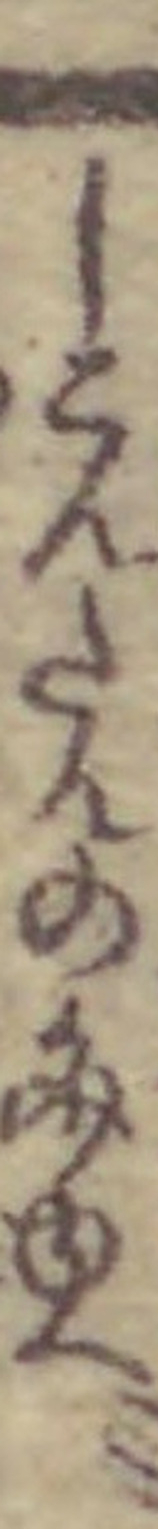しこんたんの文ゆへ
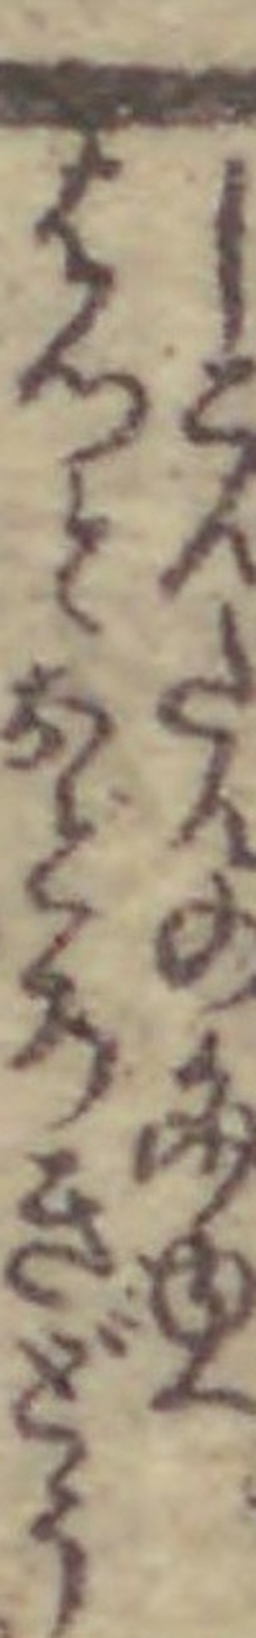はつとおどろきどう
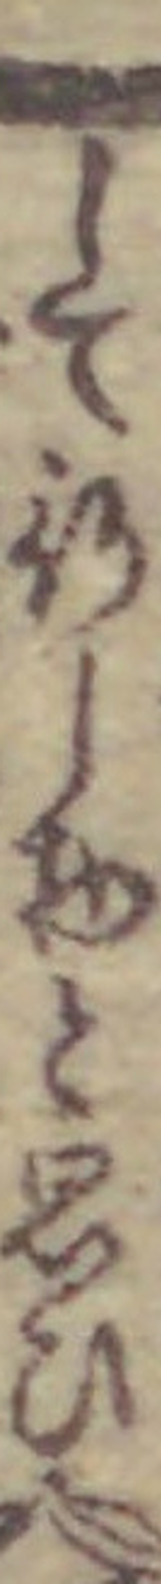して行し物と思ひ
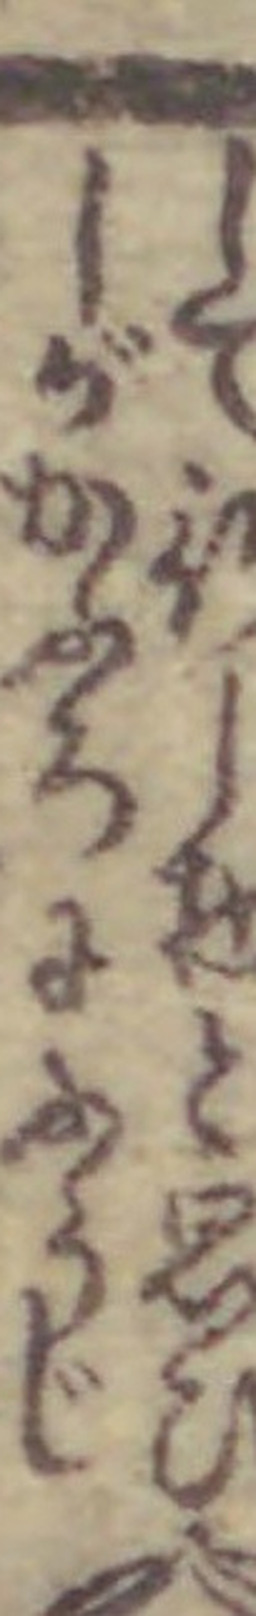しがかふろにふうじ
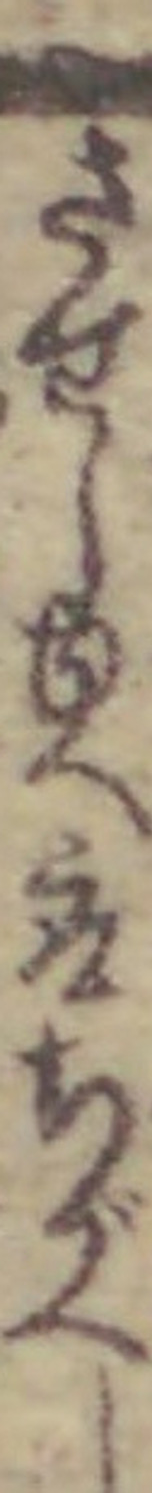させしゆへ取ちがへ
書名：間似合嘘言曽我 3巻
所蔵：国立国会図書館 National Diet Library, JAPAN
